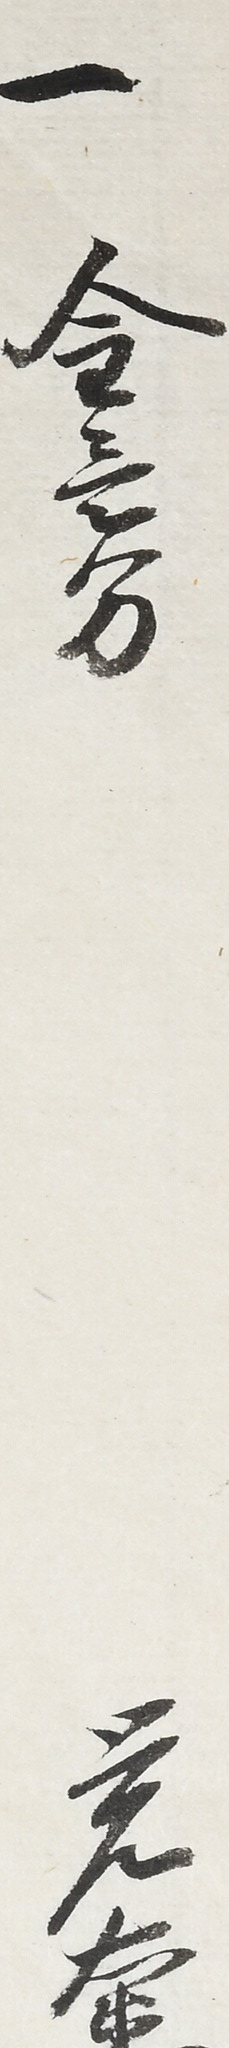一金壱分覚右衛門
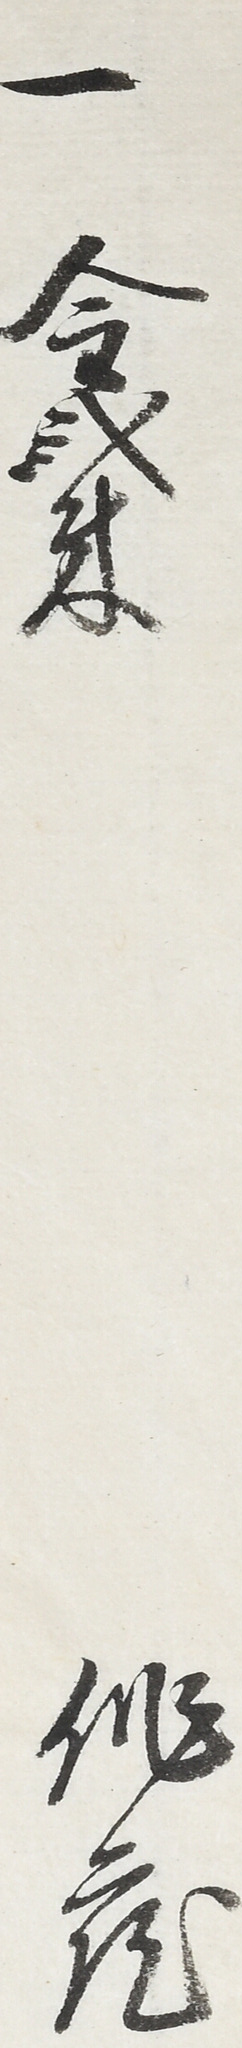一金弐朱作蔵

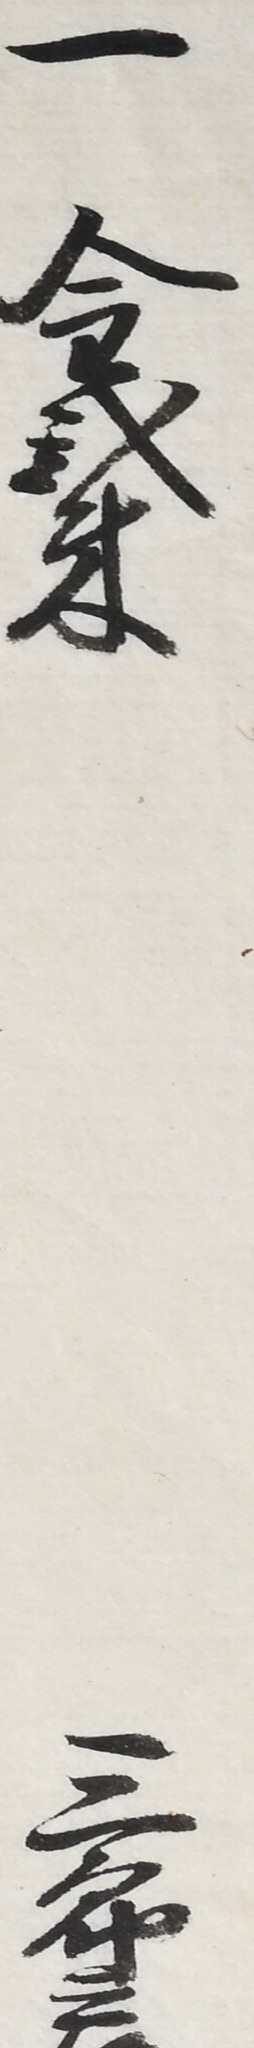一金弐朱三郎兵衛
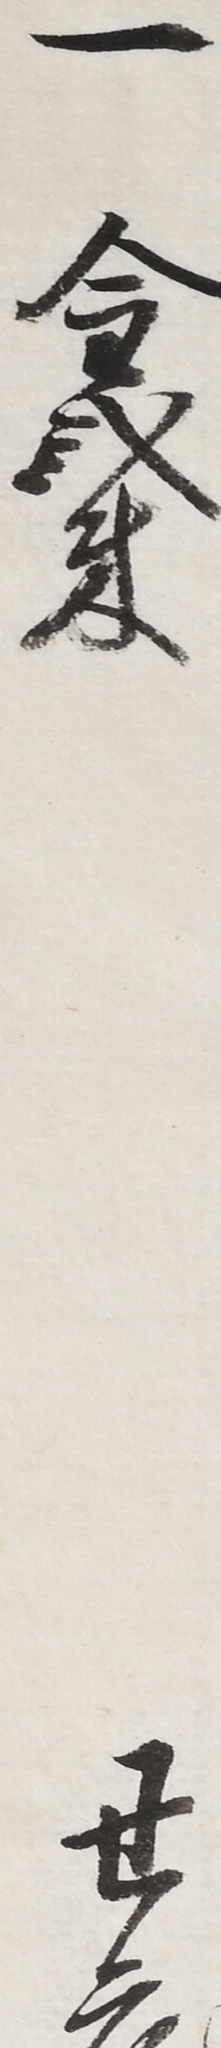一金弐朱丑蔵
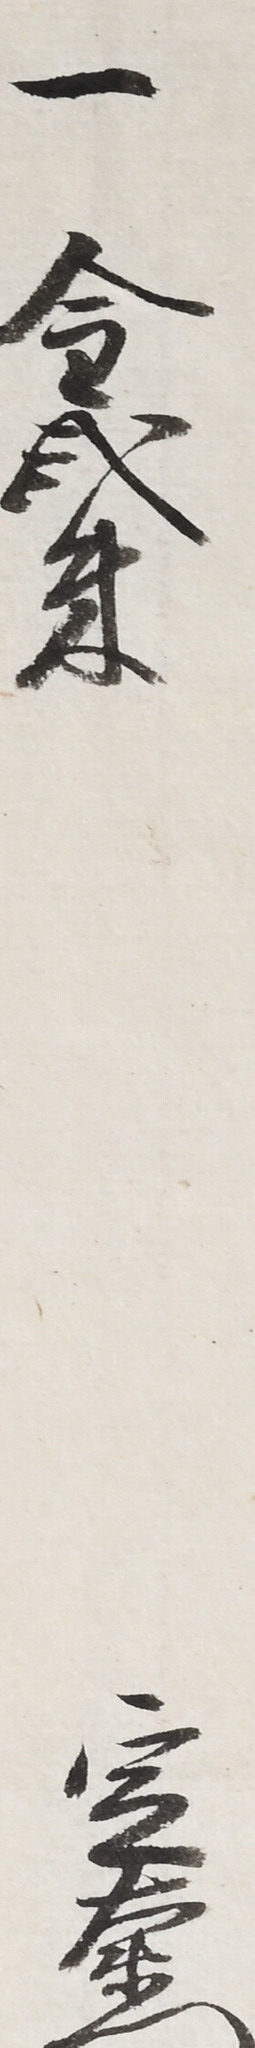一金弐朱定右衛門
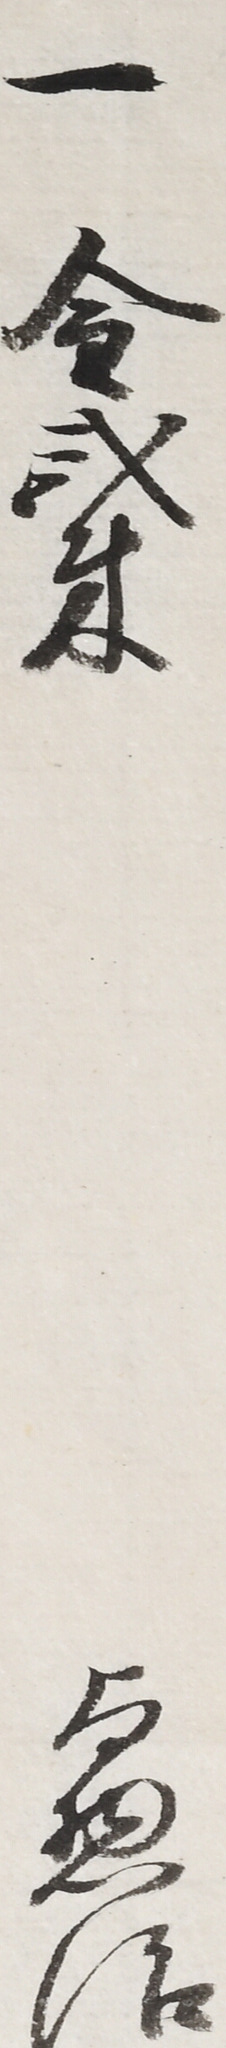一金弐朱与惣治
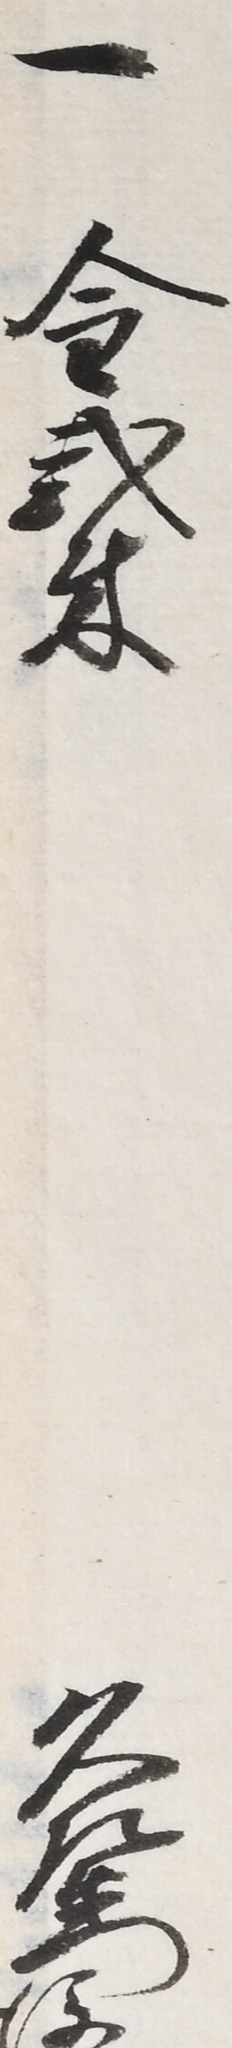一金弐朱久左衛門後家
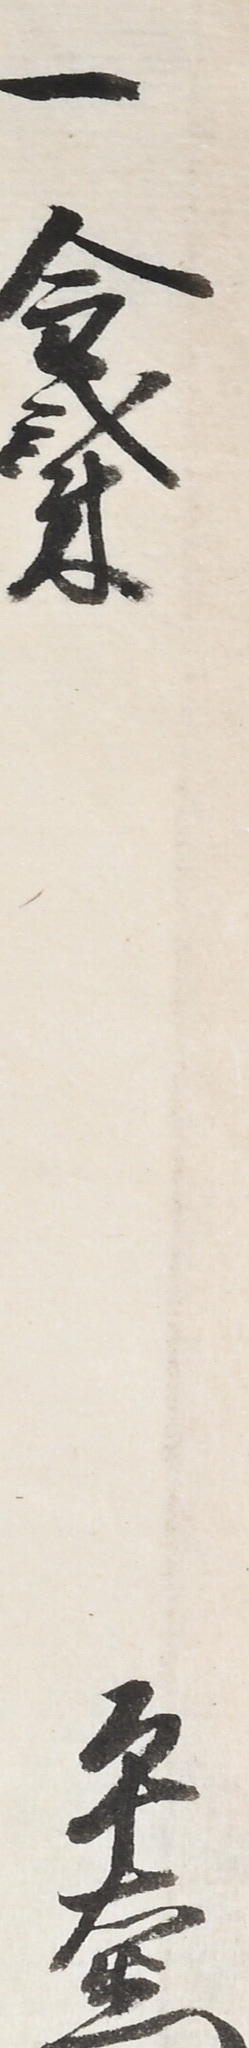一金弐朱平右衛門
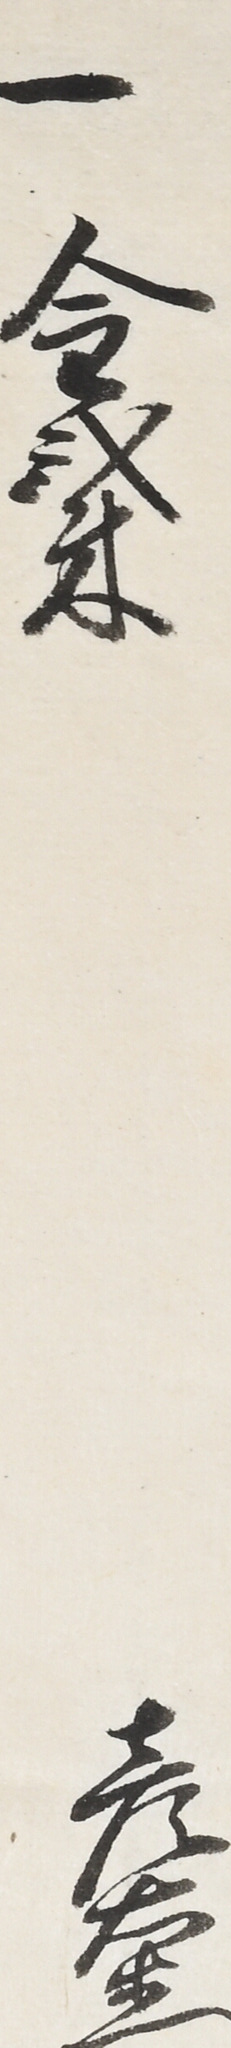一金弐朱彦右衛門
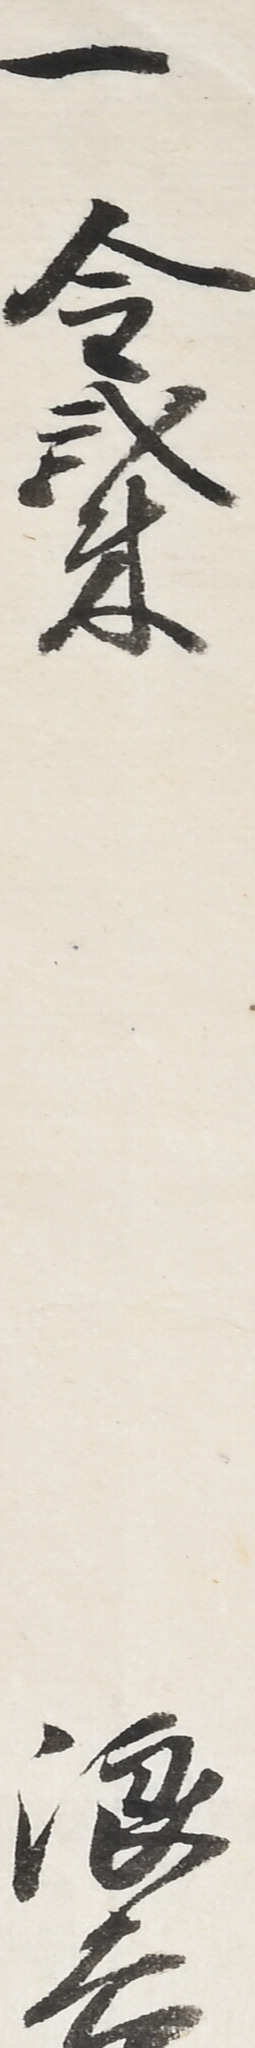一金弐朱浪吉
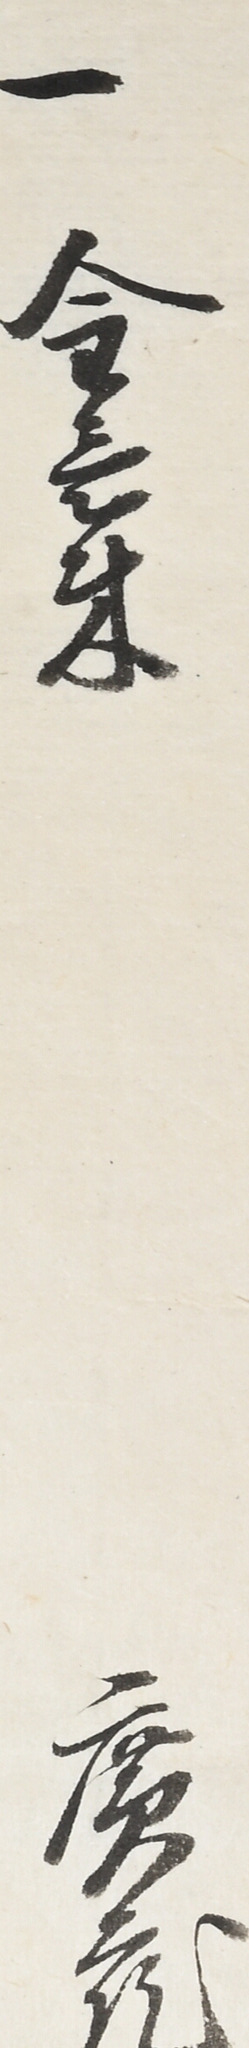一金壱朱広蔵
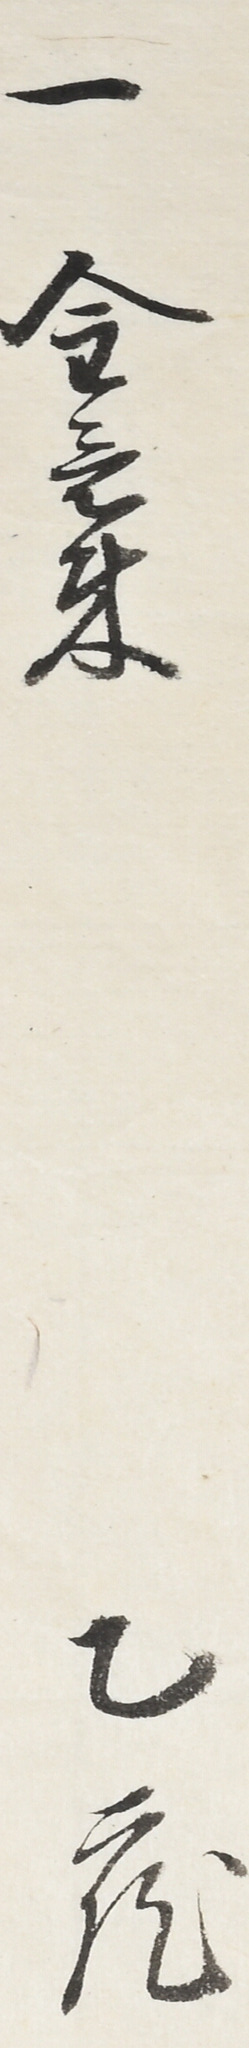一金壱朱広蔵

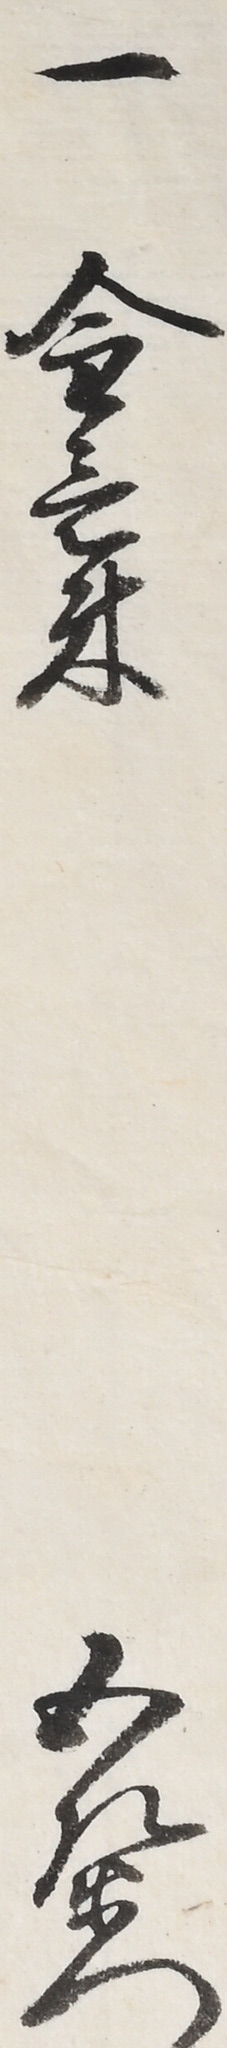一金壱朱五左衛門
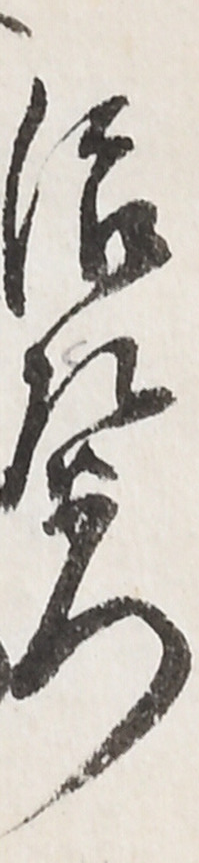治左衛門
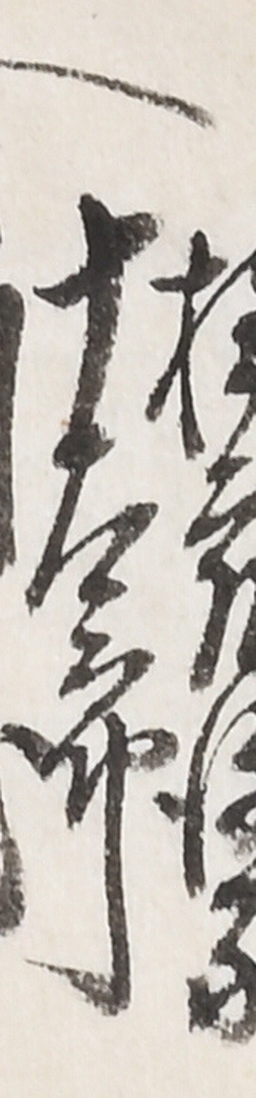十太郎
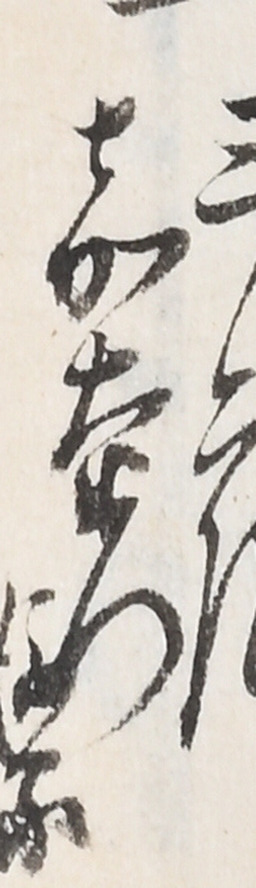嘉右衛門
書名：御拝地百五拾年御祝儀献上御目録名前
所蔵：伊那市立高遠町図書館・合同会社AMANE
